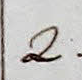2
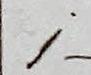1
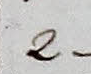2
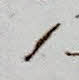1
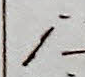1
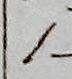1
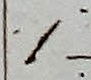1
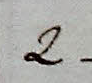2
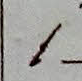1
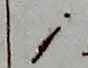1
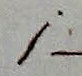1
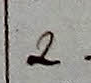2
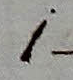1
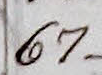67
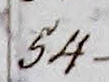54
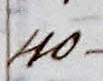40
